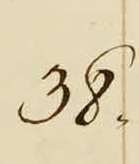38
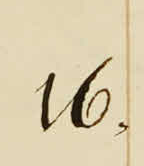16
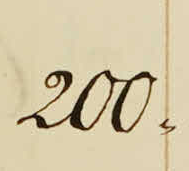200
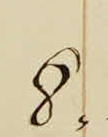8
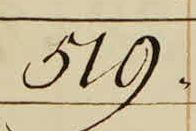519
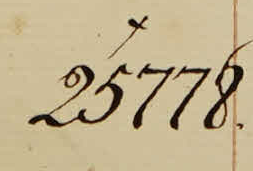25778
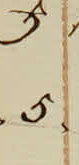5
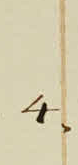4
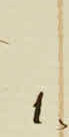1
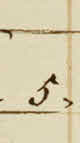5
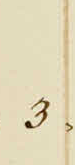3
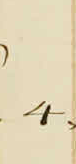4
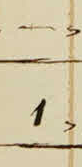1
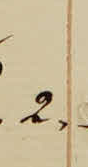2
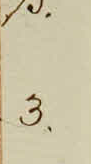3.
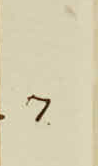7.
